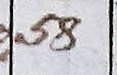58
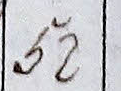52
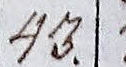43.
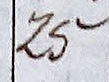25
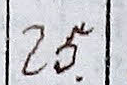25.
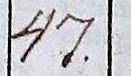47.
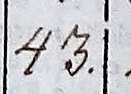43.
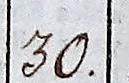30.
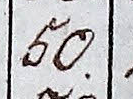50.
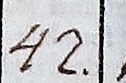42.
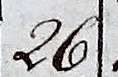26
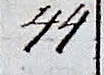44
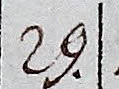29.
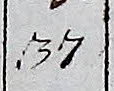37
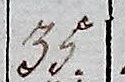35.
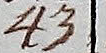43
